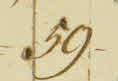59
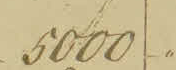5000.
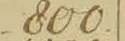800.
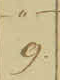9.
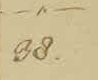38.
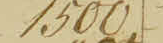1500
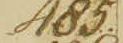485.
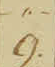9.
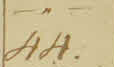44.
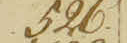526.
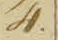4.
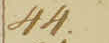44.
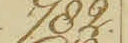782.
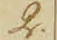2.
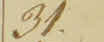31.
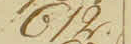612.
